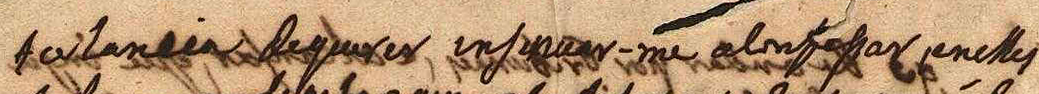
tulancia de querer insinuar-me a confessar e nelles
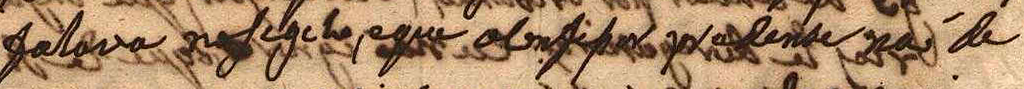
falava no segelo, e que o Confessor prudente naõ de
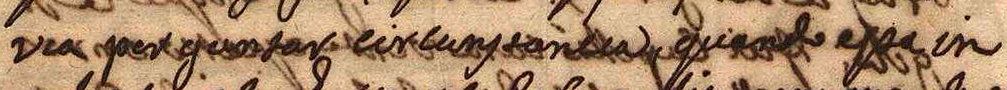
via perguntar circunstancia, quando esta in
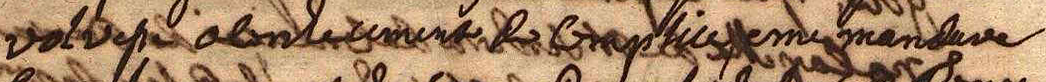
volvesse o conhecimento do Complice, e me mandava
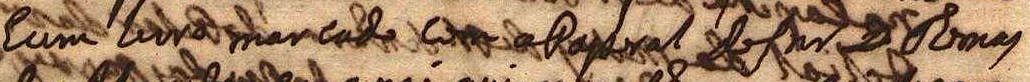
hum livro marcado com a Pastoral o Snr. D Thomas
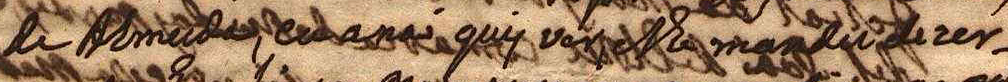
de Almeida, eu a naõ quis ver e lhe mandei dezer
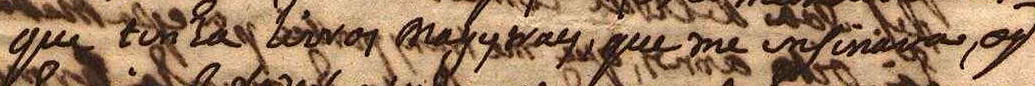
que tinha livros magestraes, que me ensinavaõ o q̄
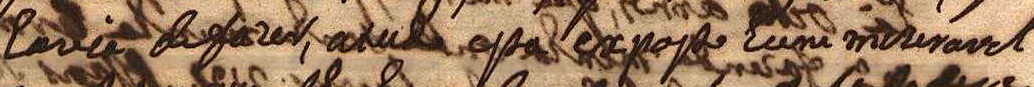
havia de fazer, a tudo esta exposto hum mezeravel
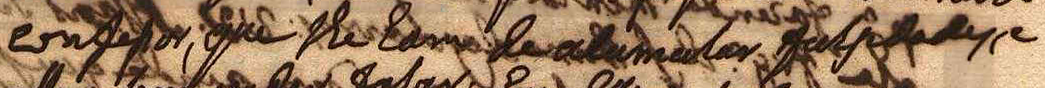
confessor, que lhe ham de acumalar falsidades, e
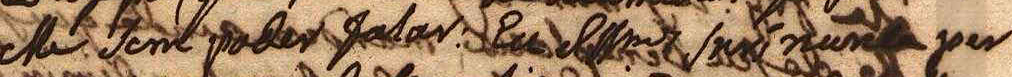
elle sem poder falar. Eu ell.mos Snors nunca per
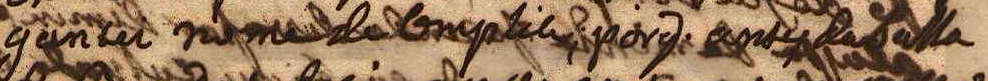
guntei nome da Complice, porq̄ antes da bulla
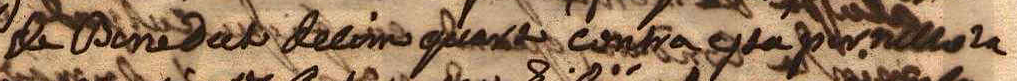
de Benedicto decimo quarta contra esta perneceoza
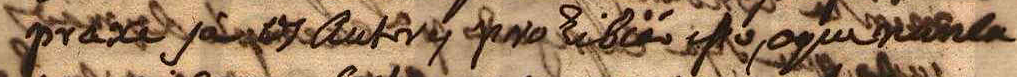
praxe já os Autores prohibião isso, o que nunca
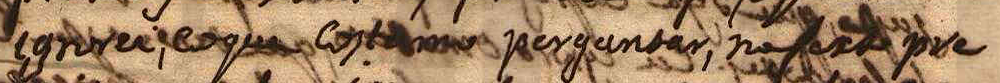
egnorei, e o que costumo perguntar, no sexto pre
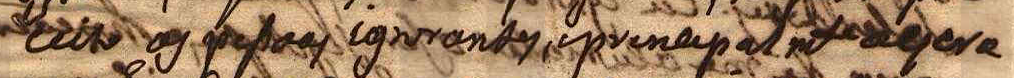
ceito as pessoas ignorantes, e prencepalm.te a escra
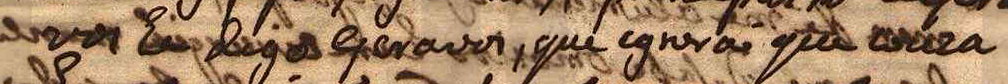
vos Eu digo ecravos, que egnoraõ que couza
